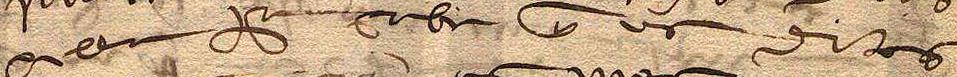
e ella tsa sabe q̄ os ditos
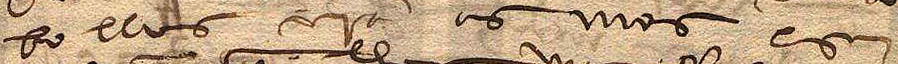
bollos erā asmos e sem
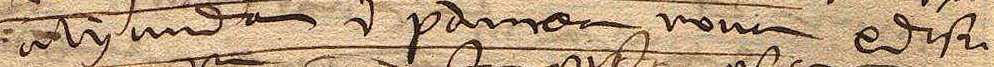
a vyanda ē panella noua e dise
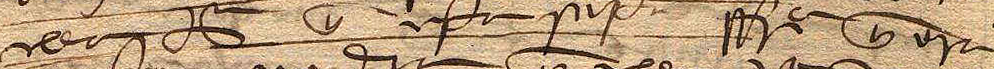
ella tsa q̄ esta sesta ffra q̄ ora
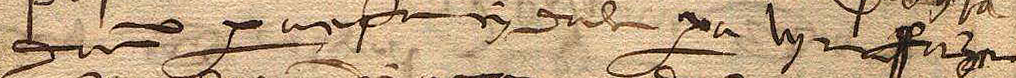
dauo ꝑa esta cydade ꝑa vyr ffazer
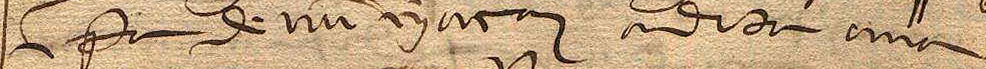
esta denūcyaçam a dita ana
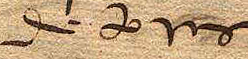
de tores
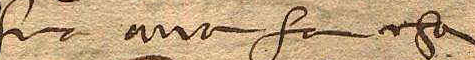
sua ama ha cha
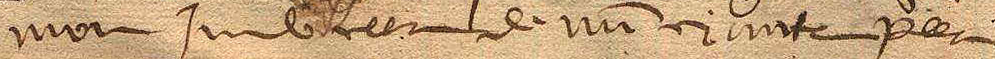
mou Jndo ella denūcyante pella
